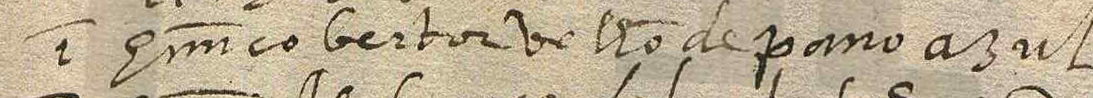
item hūu cobertor velho de pano azul
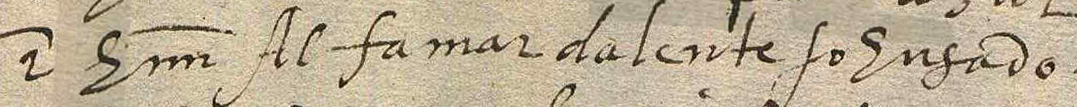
item hūu Alfamar dalenteJo husado
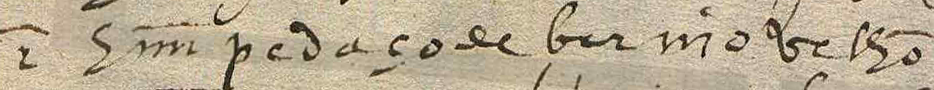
item hūu pedaço de bernio velho
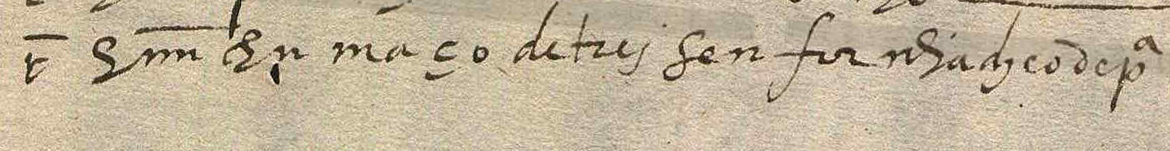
item hūu chumaço de tres sen fornha cheo de pa
